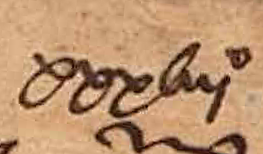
xxxbijo
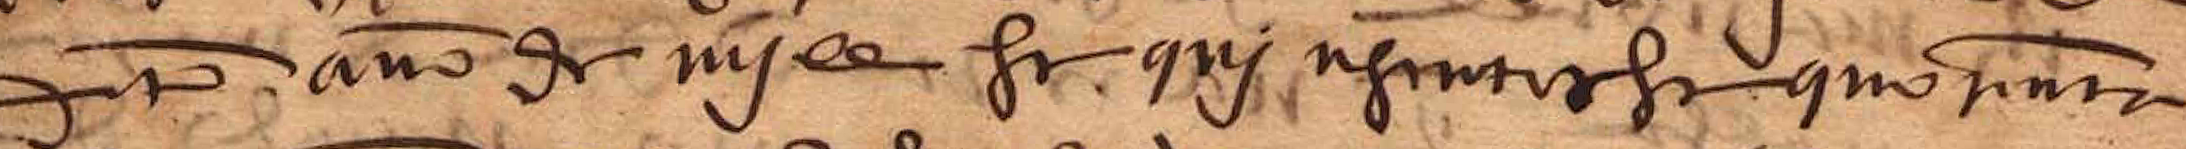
dito an̄o de mjll he qujnhentos he quorenta
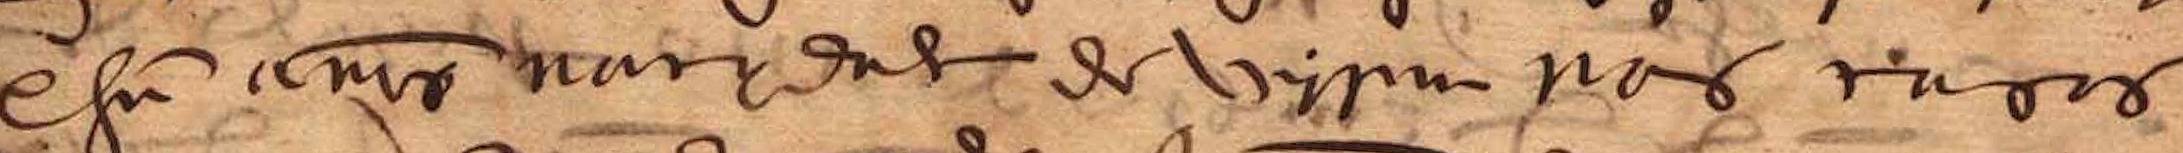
e hū an̄os na cydade de Vyseu nas casas
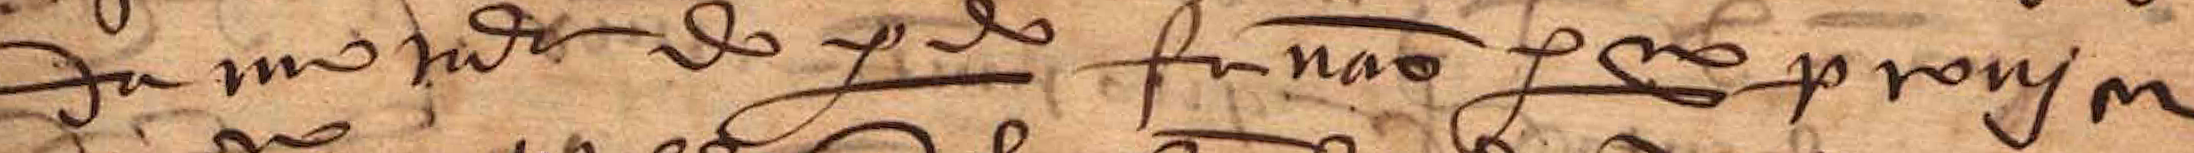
da morada do Ldo fernão Lco proujsor
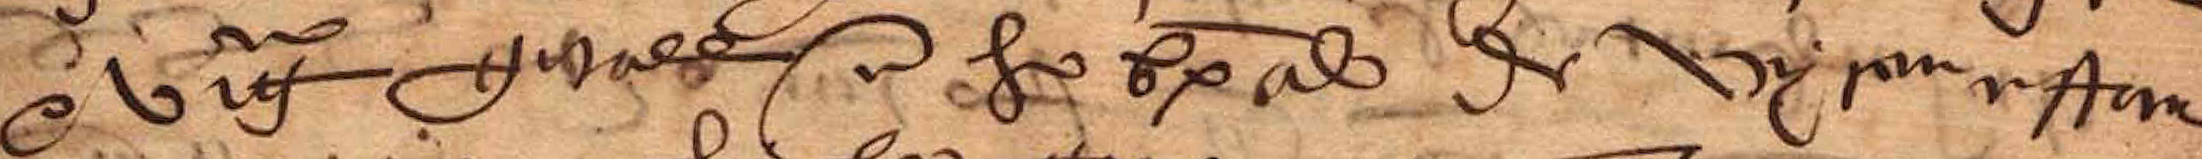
e vigro girall ē ho b̄pado de Vyseu estam
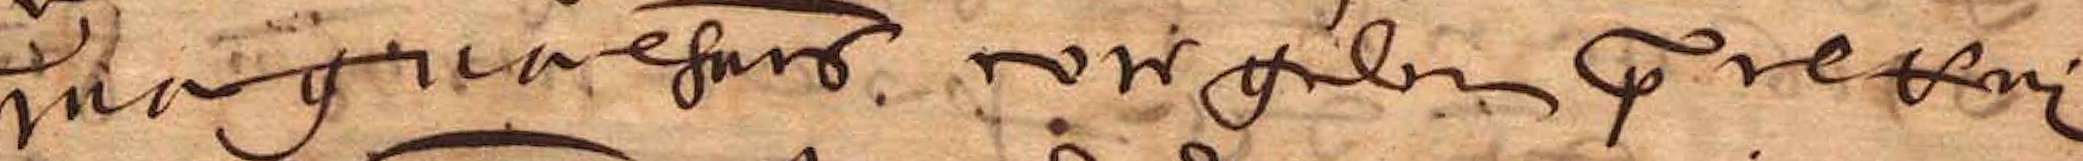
magualhães coregedor p̄o el Rey
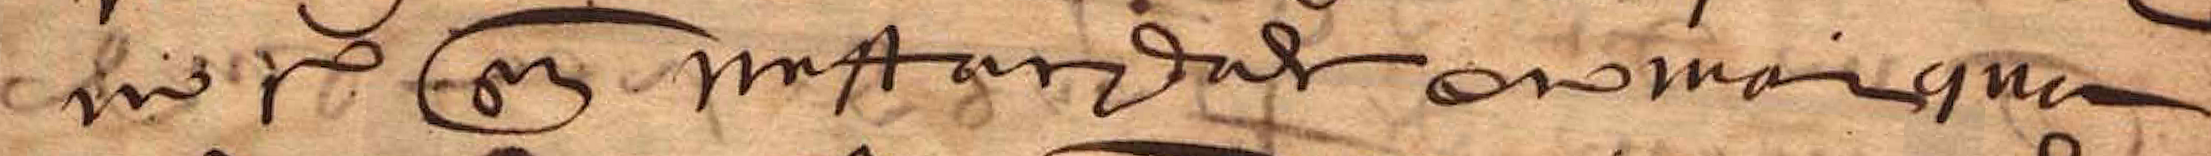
noso s̄or nesta cjdade e comarqua
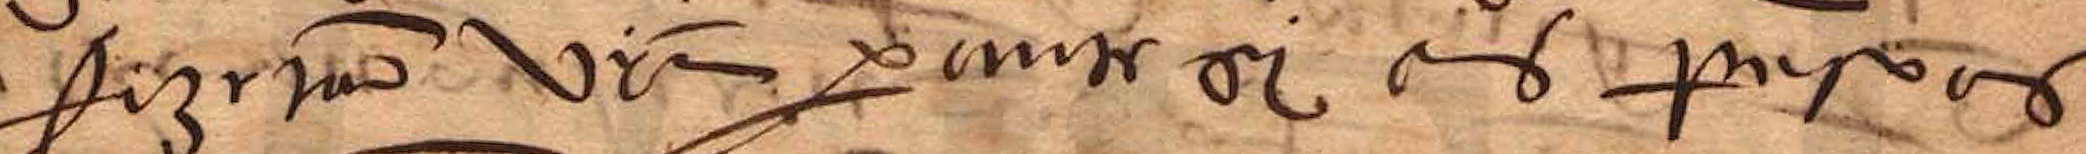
fizerão vyr ꝑante sy as pesoas
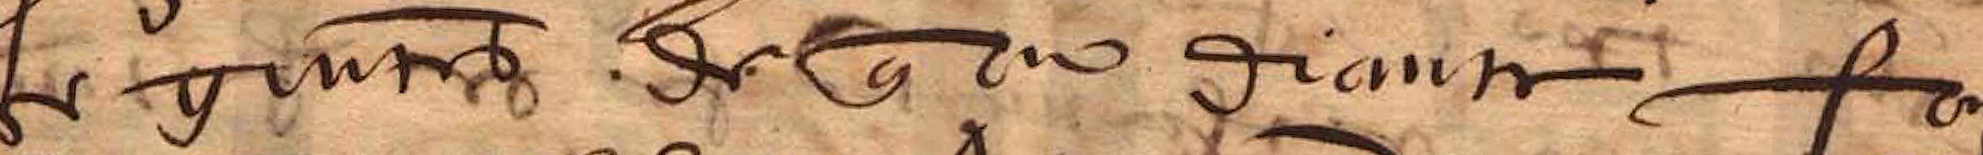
seguītes de q̄ ao diante faz
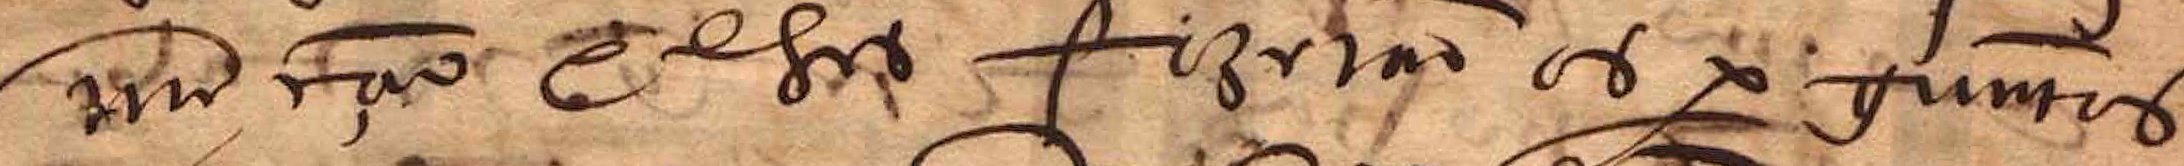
mēção e lhes fyzerão as ꝑguntas
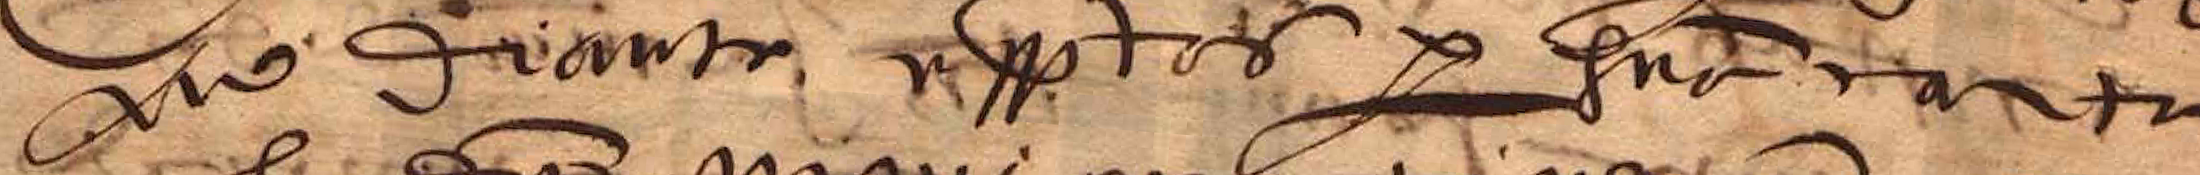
Ao diante esp̄tas ꝑ huā carta
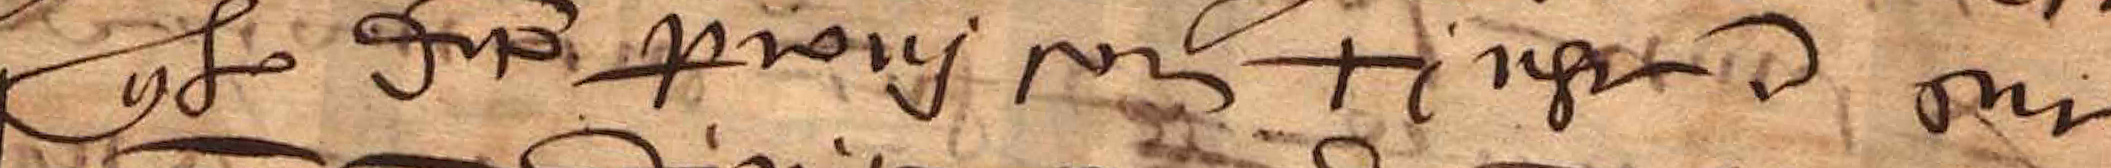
q̄ ho dito proujsor tynha ē sua
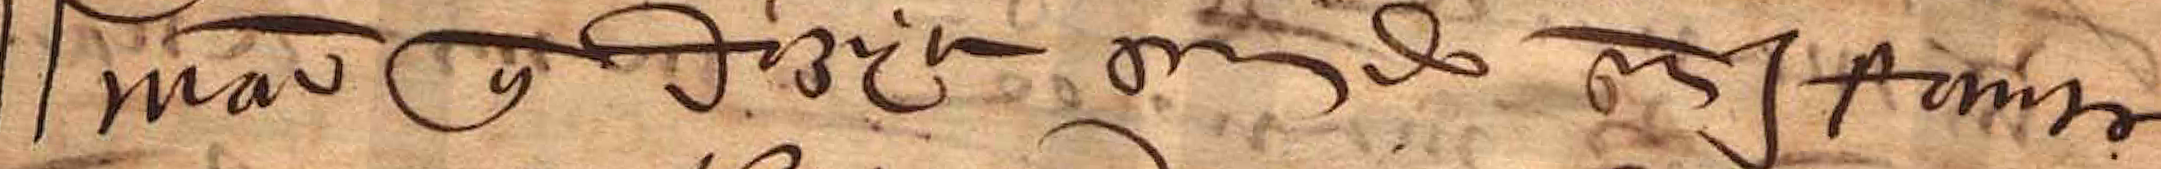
mão q̄ dizya ser do s̄or Jfante
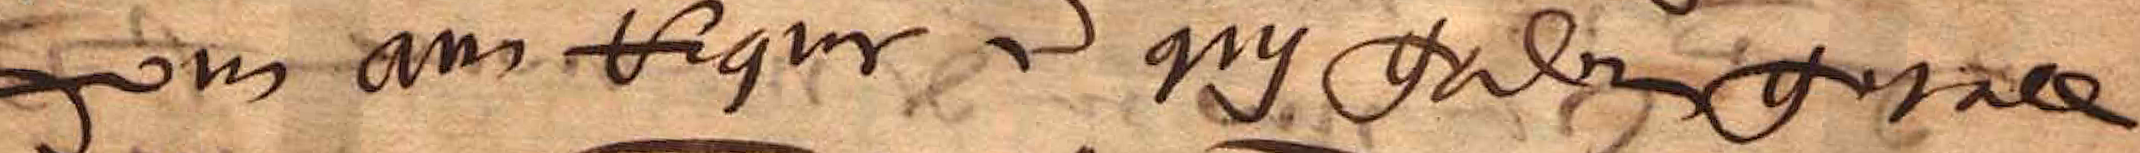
dom amRique ēqujgydor gerall
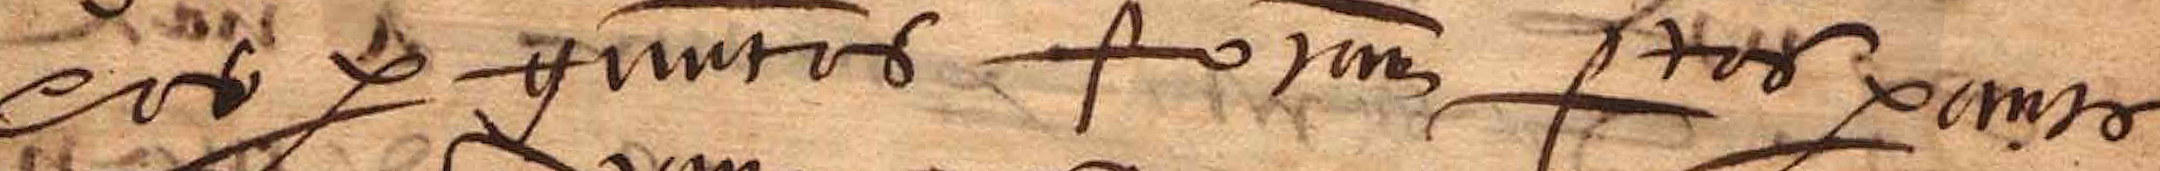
e as ꝑguntas foram ftas ꝓante
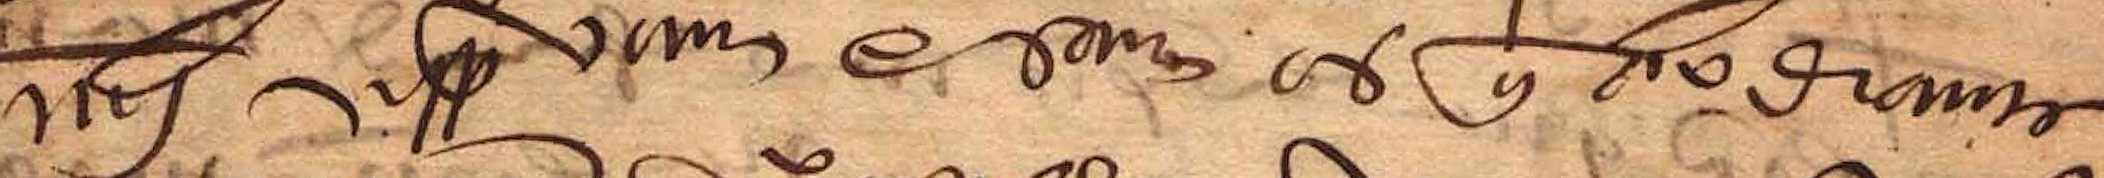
m̄j esp̄vam e sam as q̄ ao diante
